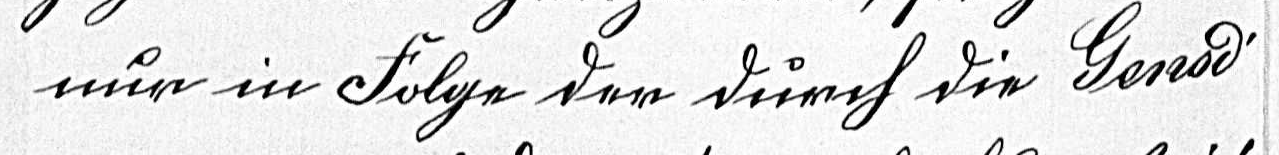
nur in Folge der durch die Genod¬
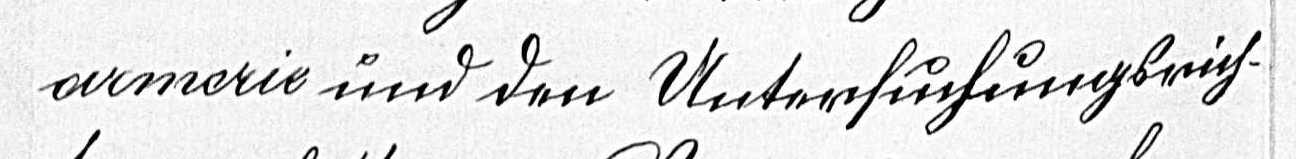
armerie und den Untersuchungsrich¬
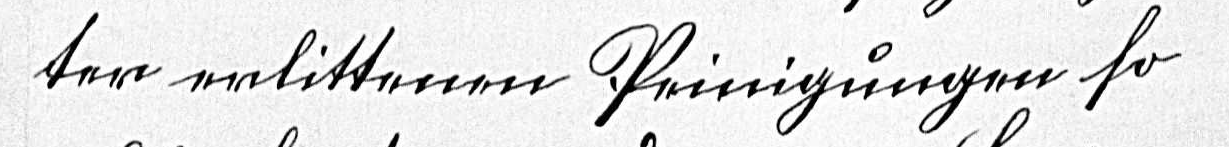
ter erlittenen Peinigungen so
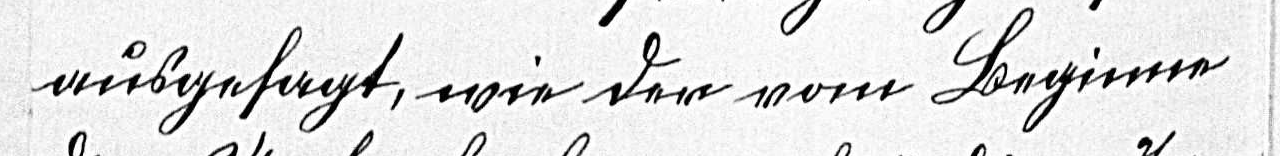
ausgesagt, wie der vom Beginne
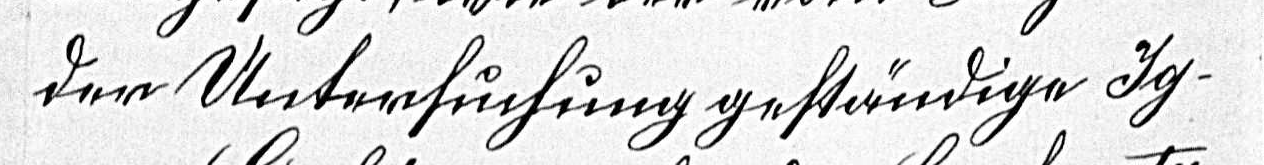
der Untersuchung geständige Jg¬
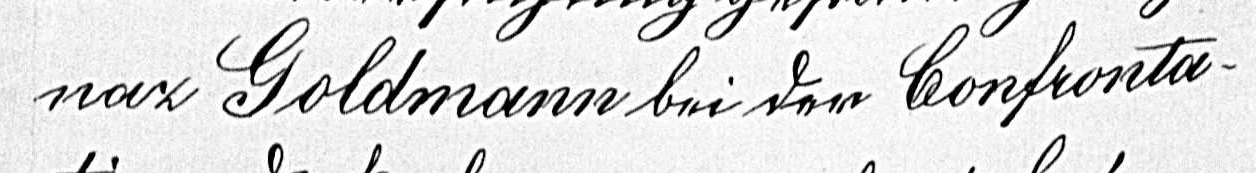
naz Goldmann bei der Confronta¬
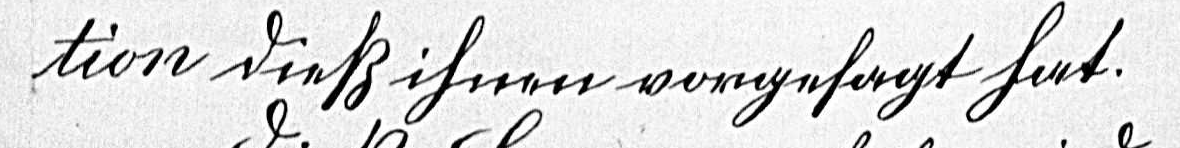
tion dieß ihnen vorgesagt hat.
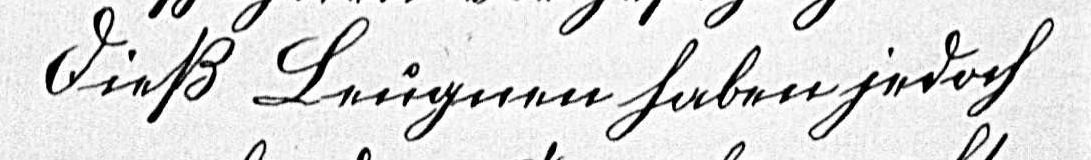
Dieß Leugnen haben jedoch
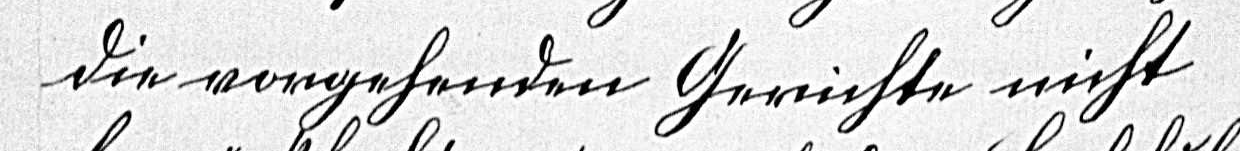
die vorgehenden Gerichte nicht
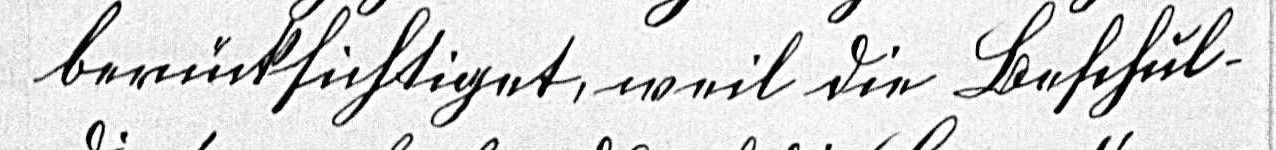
berücksichtiget, weil die Beschul¬
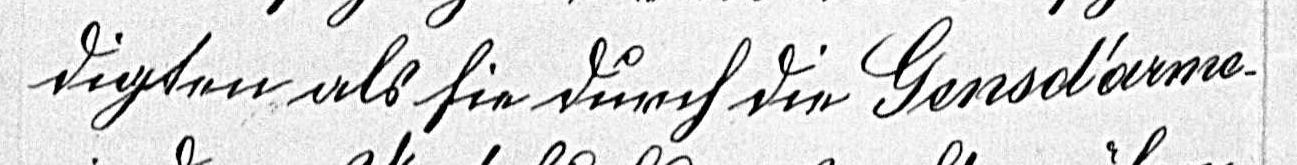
digten als sie durch die Gend'arme¬
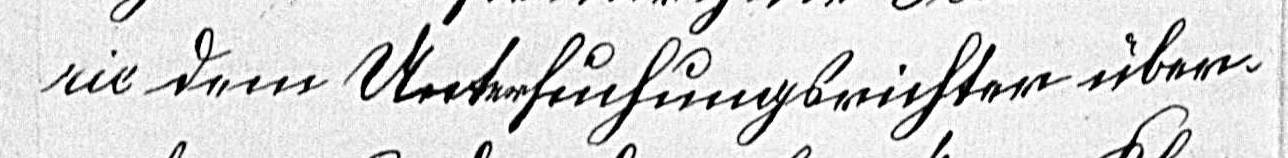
rie dem Untersuchungsrichter über¬
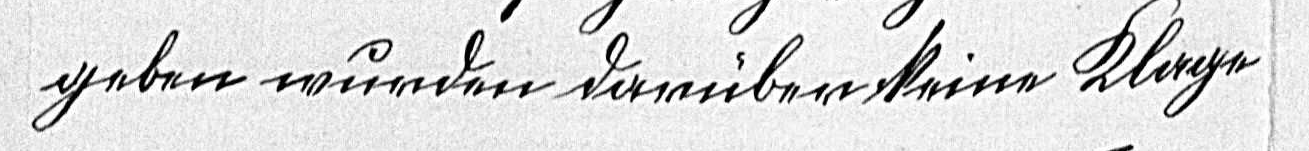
geben wurden darüber keine Klage
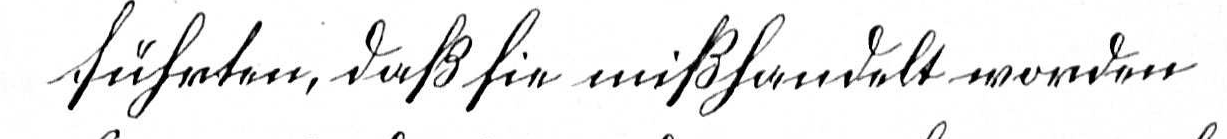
führten, daß sie mißhandelt vorden
